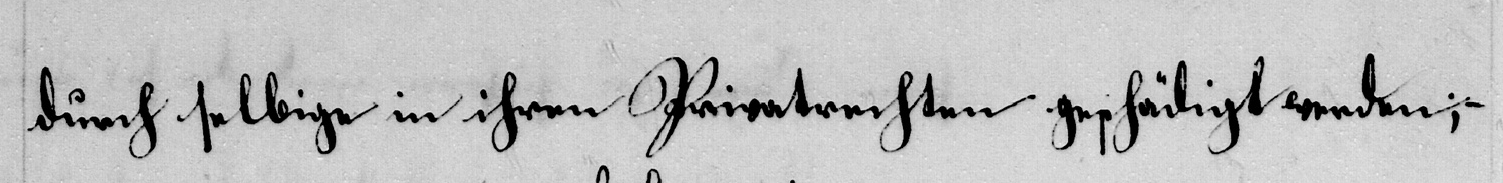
durch selbige in ihren Privatrechten geschädigt werden;
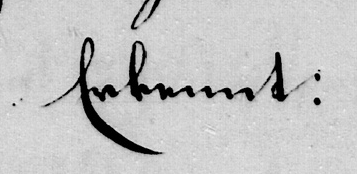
Erkennt:
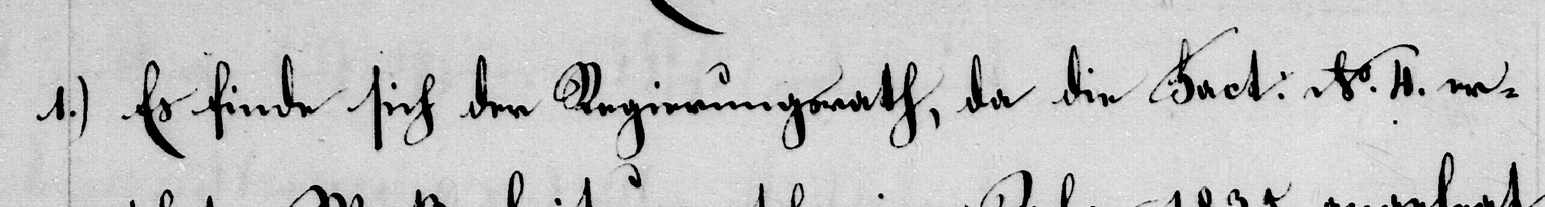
1.) Es finde sich der Regierungsrath, da die Fact: N0.4. er¬
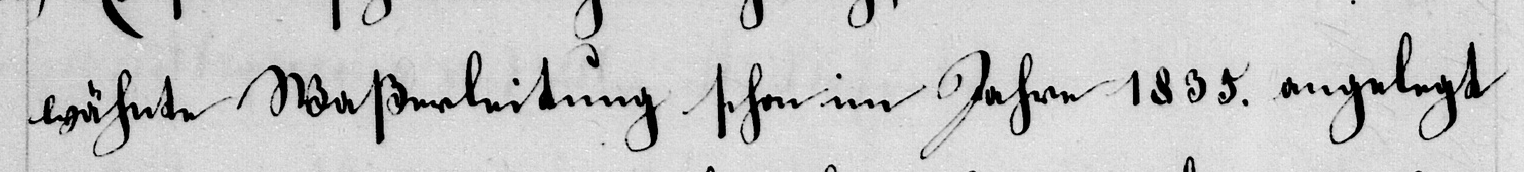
wähnte Waßerleitung schon im Jahre 1835. angelegt
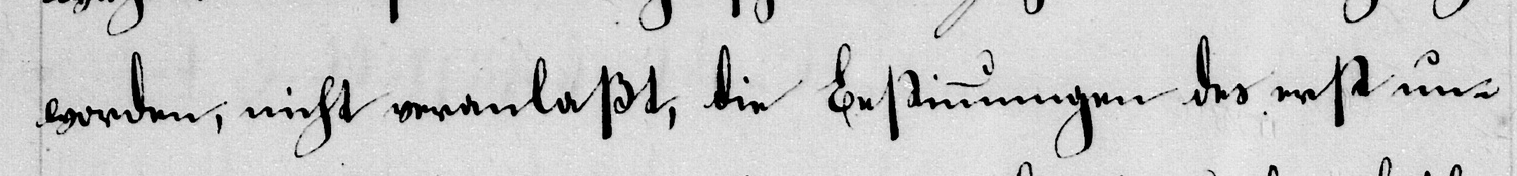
worden, nicht veranlaßt, die Bestimmungen des erst un¬
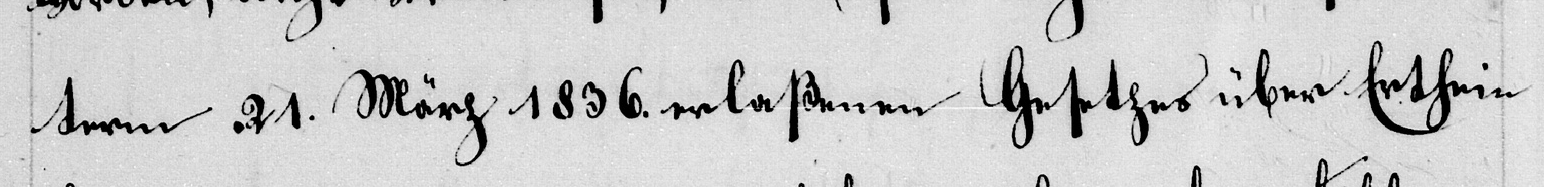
term 21. März 1836. erlaßenen Gesetzes über Erthei¬
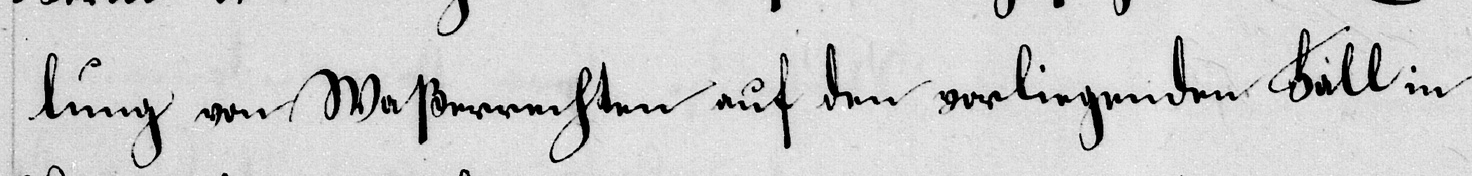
lung von Waßerrechten auf den vorliegenden Fall in
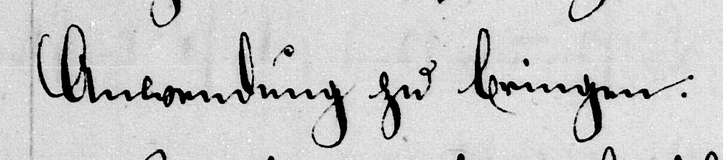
Anwendung zu bringen.
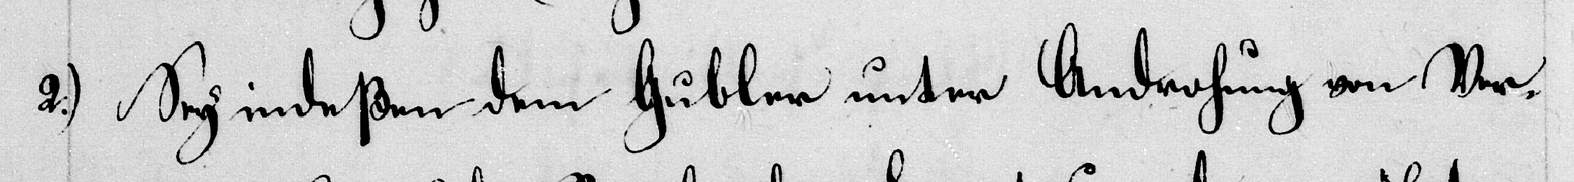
2.) Sey indeßen dem Gubler unter Androhung von Ver¬
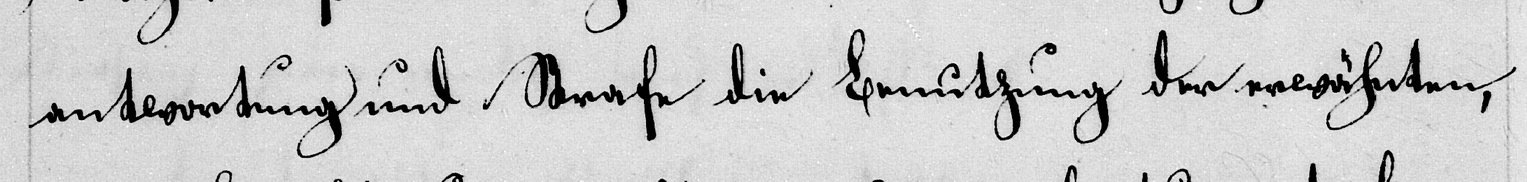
antwortung und Strafe die Benutzung der erwähnten,
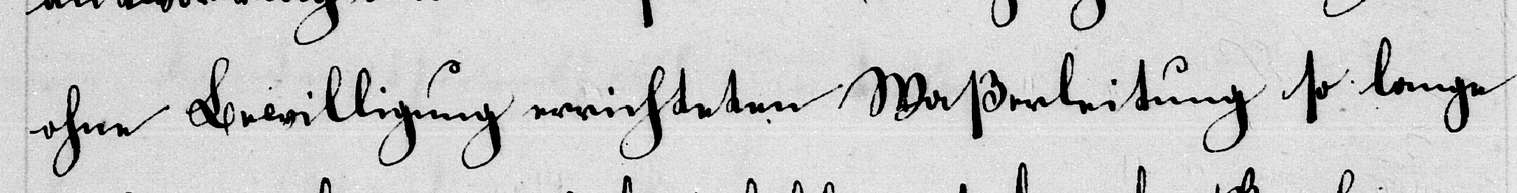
ohne Bewilligung errichteten Waßerleitung so lange
